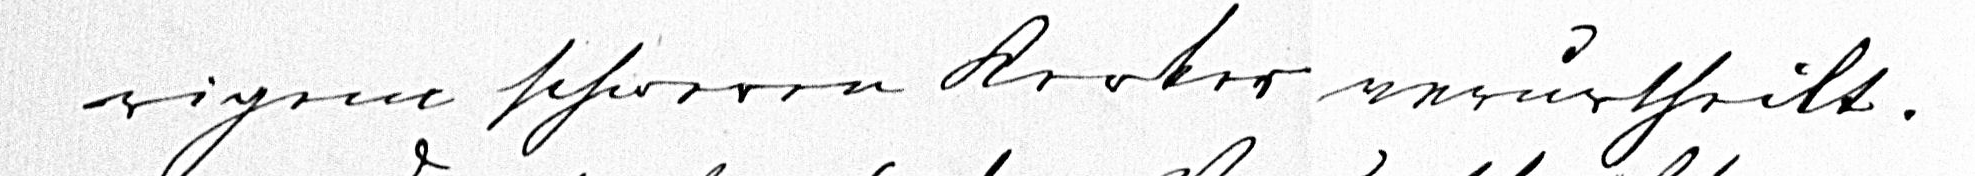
rigem schweren Kerker verurtheilt.
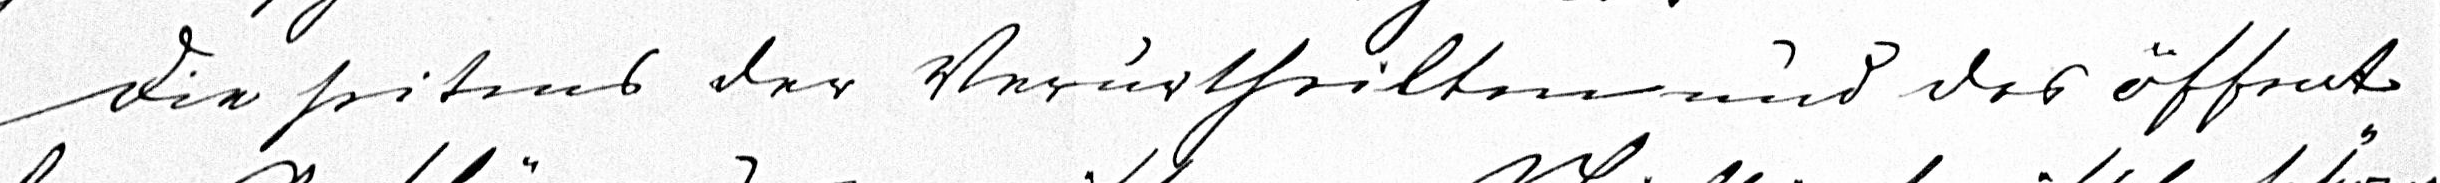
Die seitens der Verurtheilten und des öffent¬
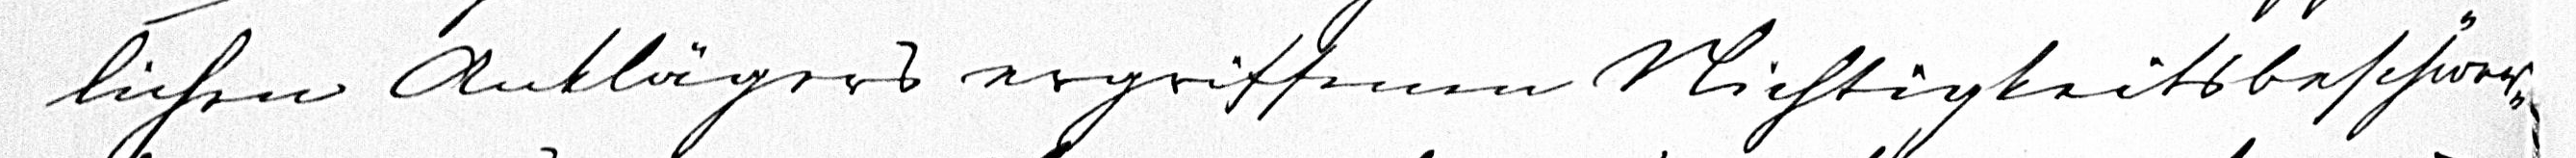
lichen Anklägers ergriffenen Nichtigkeitsbeschwer¬
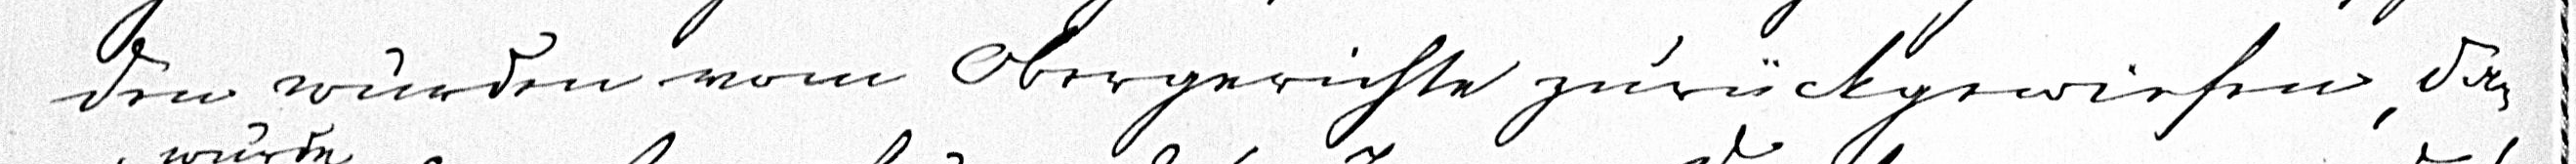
den wurden vom Obergerichte zurückgewiesen, da¬
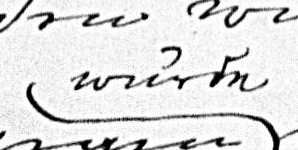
wurde
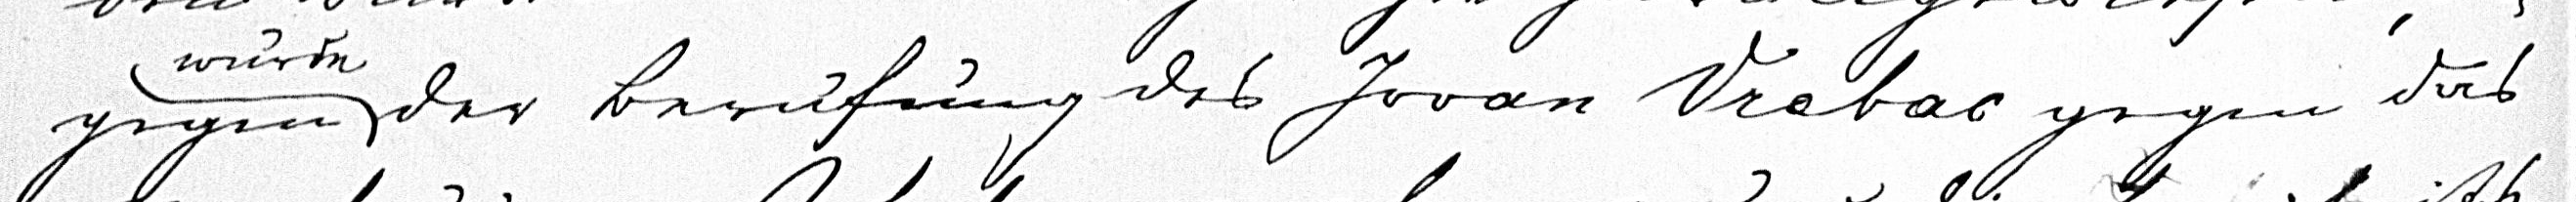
gegen der Berufung des Jovan Vrebac gegen das
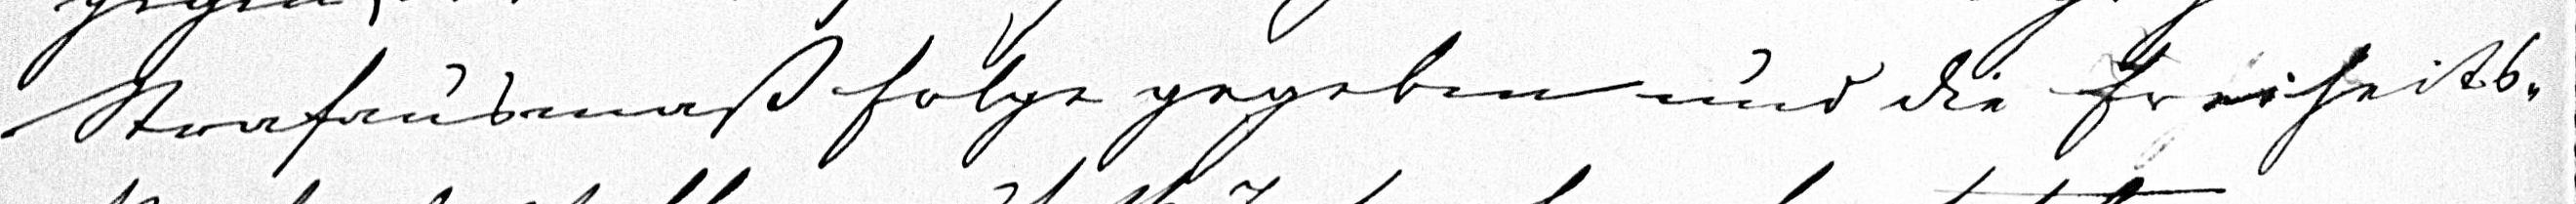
Strafausenaß folge gegeben und die Freiheits¬
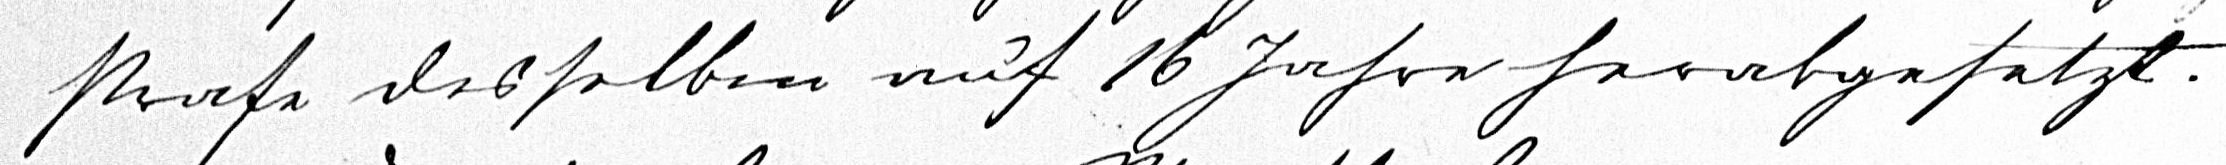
strafe desselben auf 16 Jahre herabgesetzt.
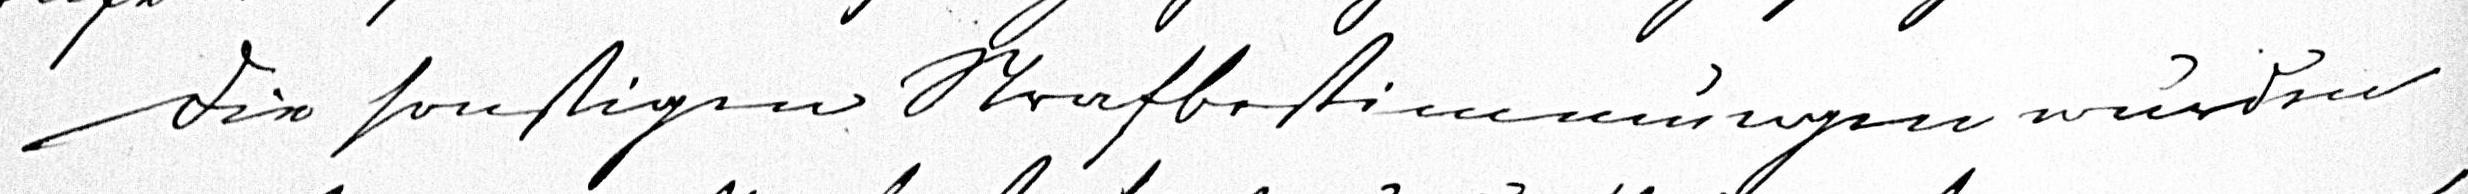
Die sonstigen Strafbestimmungen wurden
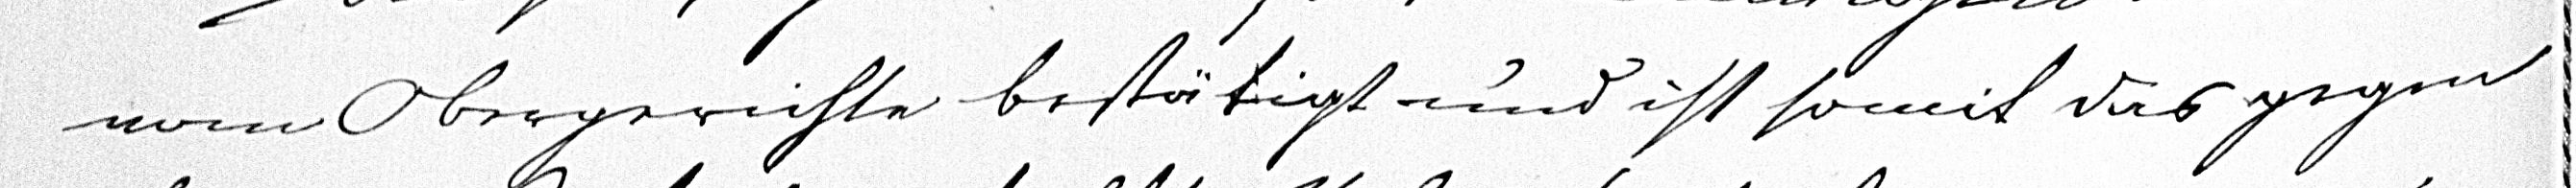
vom Obergerichte bestätigt und ist somit das gegen
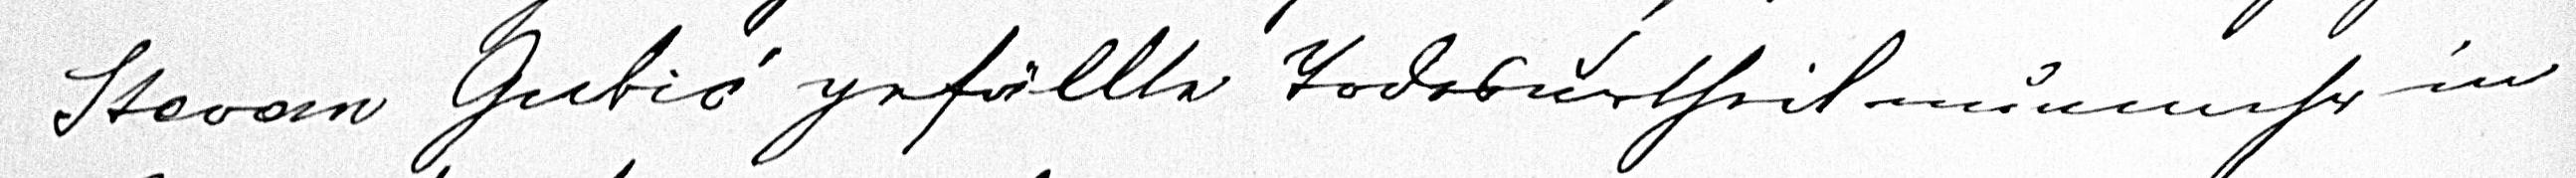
Stevan Gubić gefällte Todesurtheil nunmehr in
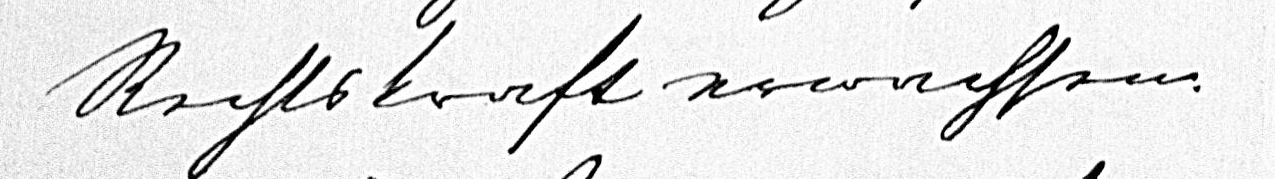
Rechtskraft erwachsen.
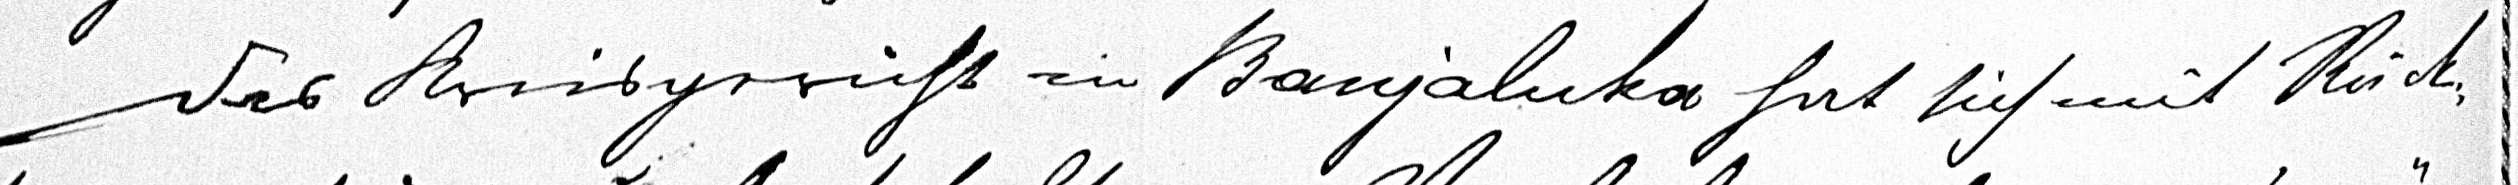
Das Kreisgericht in Banjaluka hat sich mit Rück¬
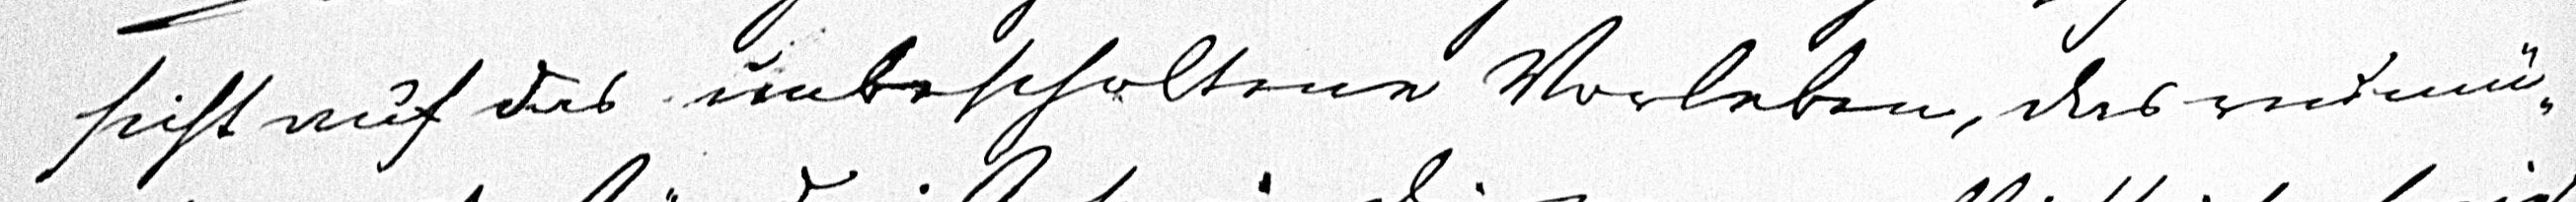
sicht auf das unbescholtene Vorleben, das reumü¬
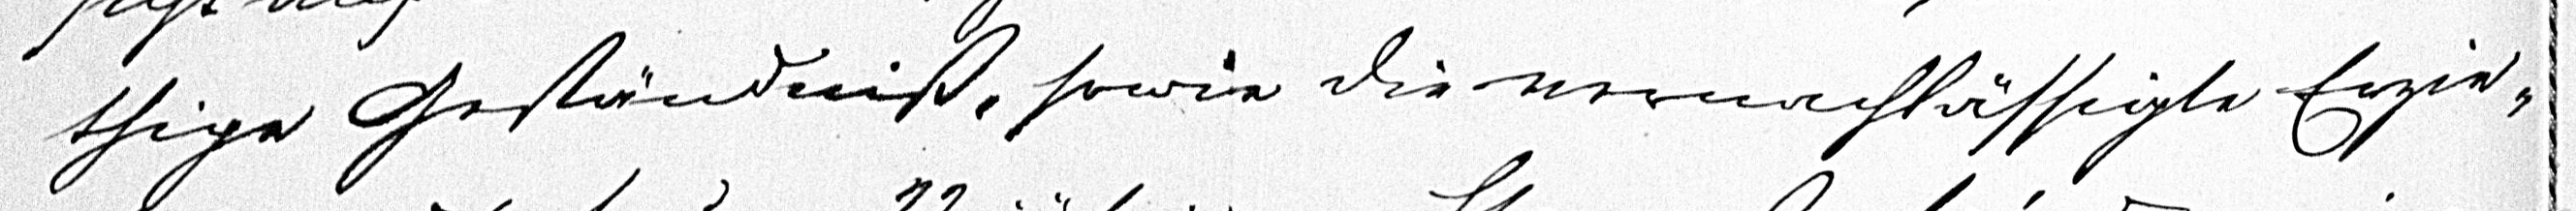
thige Geständniß, sowie die vernachlässigte Erzie¬
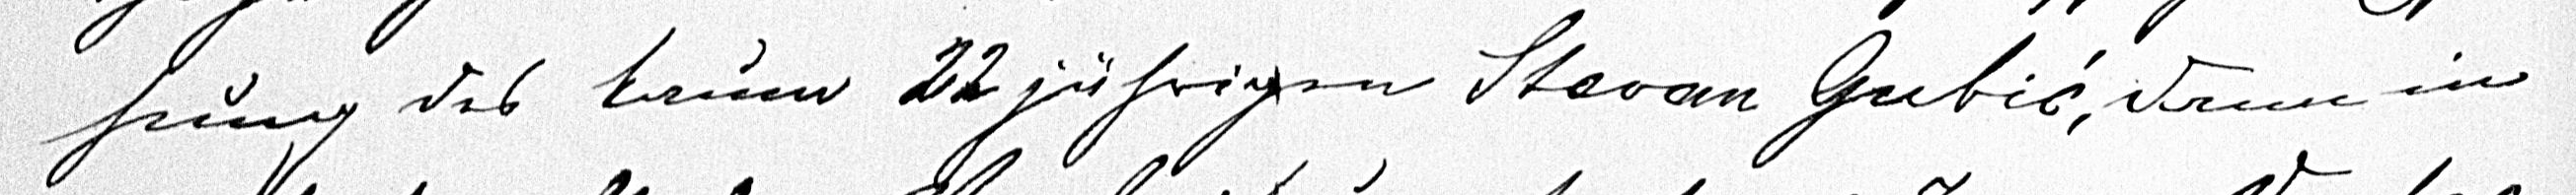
hung des kaum 22jährigen Stevan Gubić, dann in
